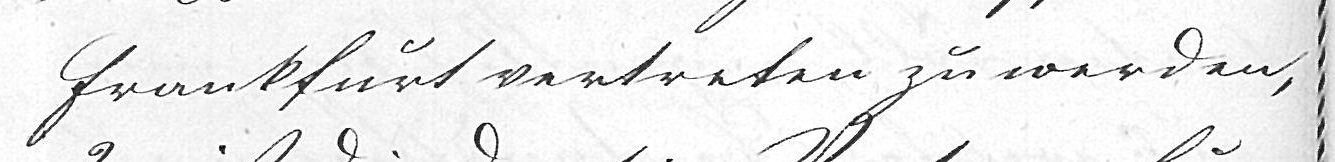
Frankfürt vertreten zu werden,
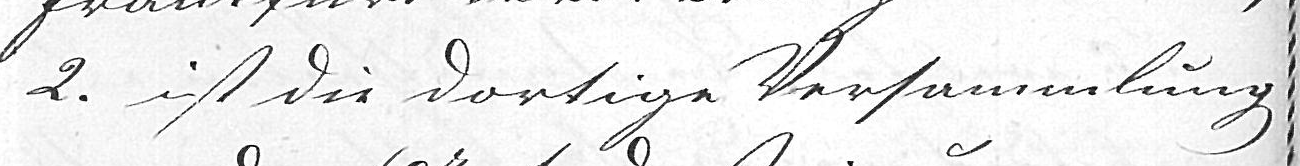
2. ist die dortige Versammlung
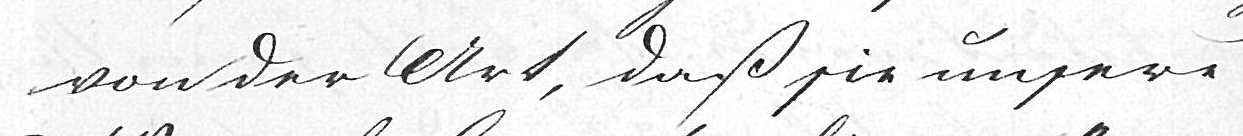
von der Art, daß sie unsere
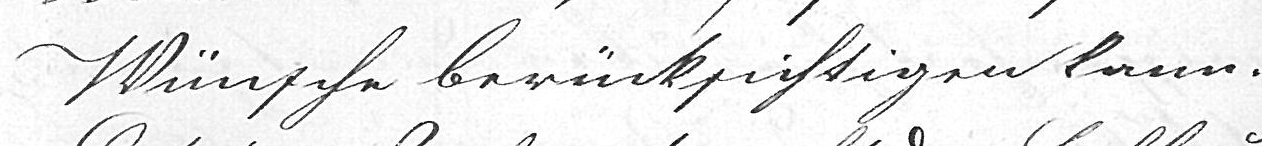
Wünsche berücksichtigen kann.
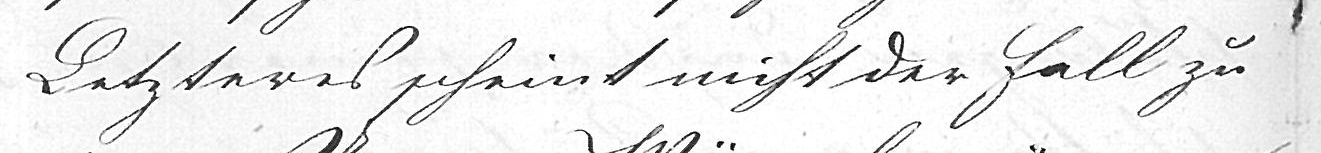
Letzteres scheint nicht der Fall zu
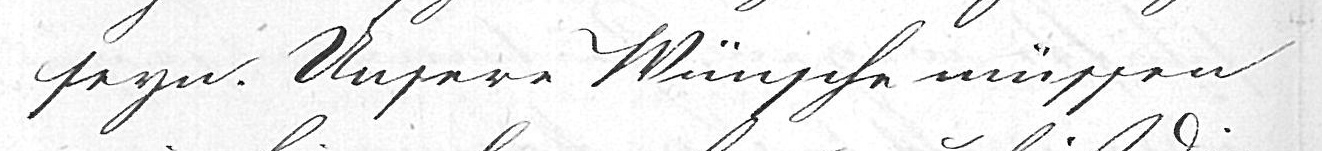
seyn. Unsere Wünsche müssen
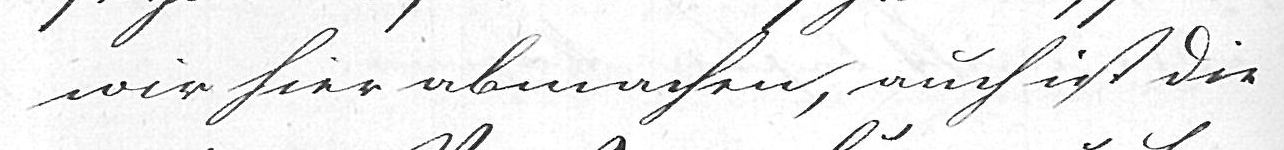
wir hier abmachen, auch ist die
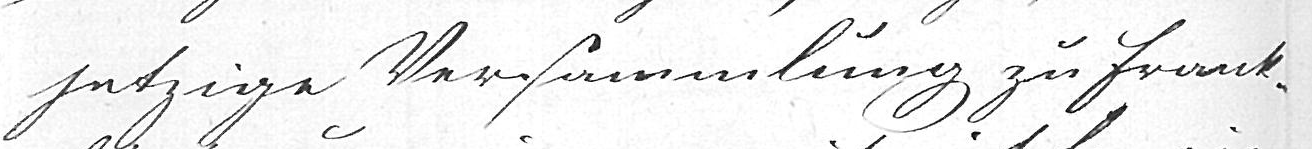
jetzige Versammlung zu Frank-
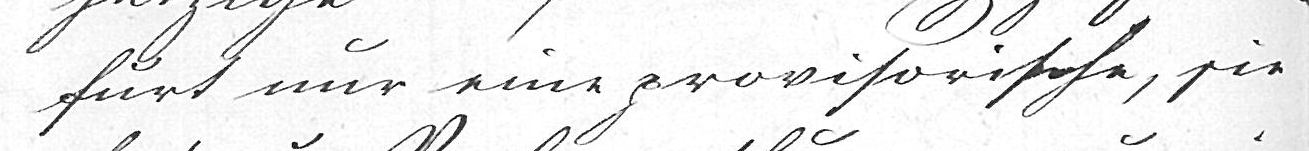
furt nur eine provisorische, sie
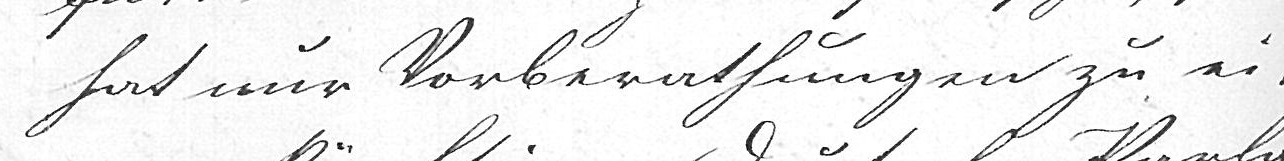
hat nur Verberathungen zu ei-
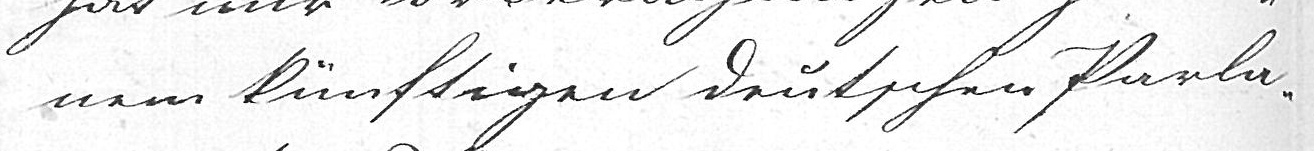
nem künftigen deutschen Parla-
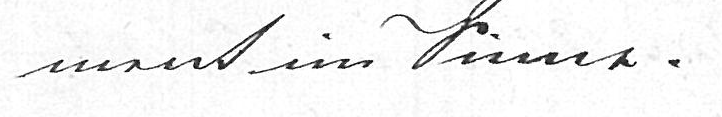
ment im Sinne.
